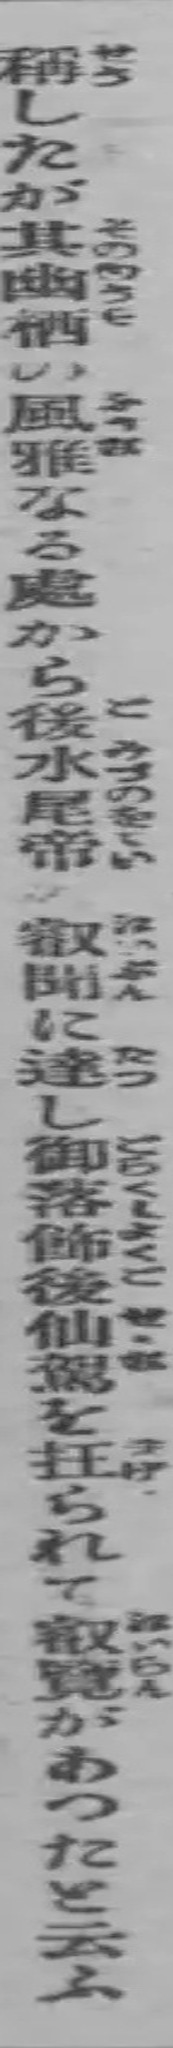称したが其幽栖の風雅なる処から後水尾帝の叡聞に達し御落飾後仙駕を抂られて叡覧があつたと云ふ

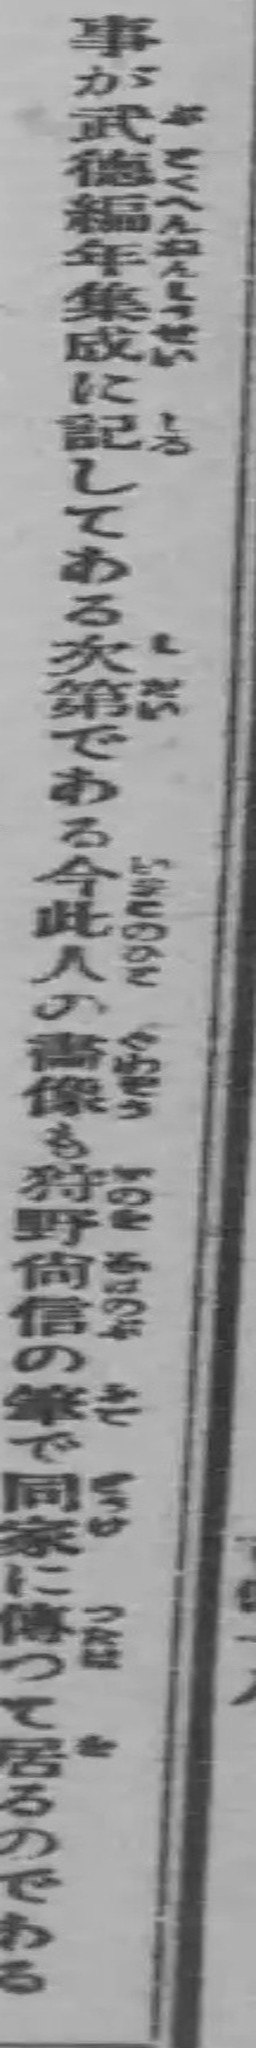事が武徳編年集成に記してある次第である今此人の画像も狩野尚信の筆で同家に伝つて居るのである
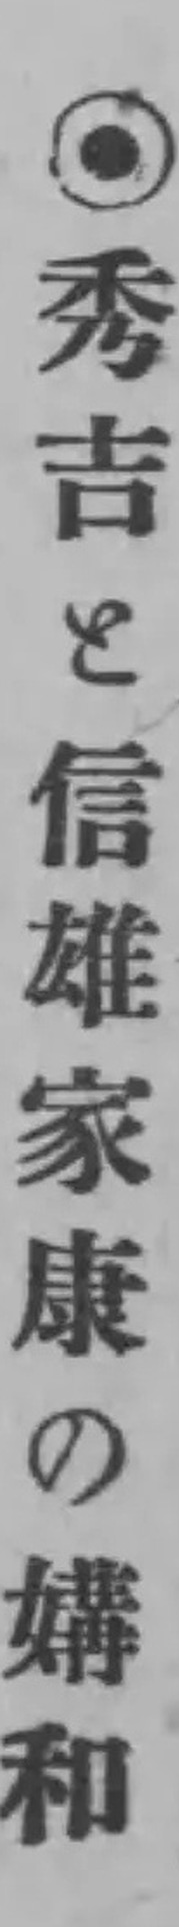⦿秀吉と信雄家康の媾和
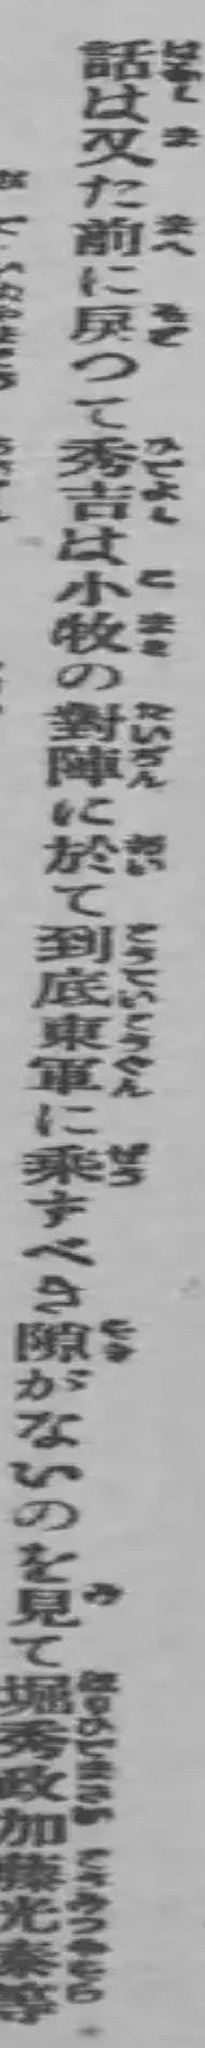話は又た前に戻つて秀吉は小牧の対陣に於て到底東軍に乗ずべき隙がないのを見て堀秀政加藤光泰等
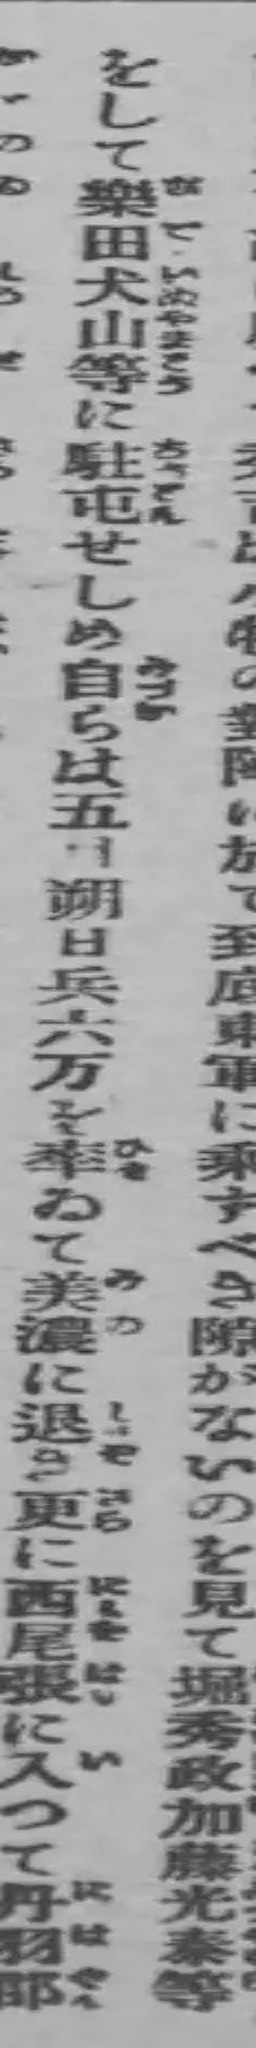をして楽田犬山等に駐屯せしめ自らは五月朔日兵六万を率ゐて美濃に退き更に西尾張に入つて丹羽郡
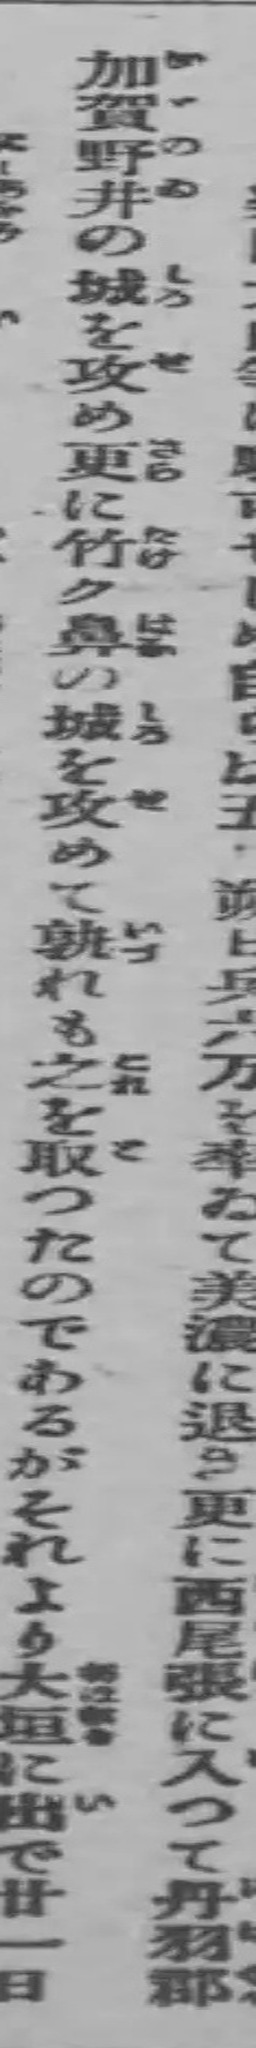加賀野井の城を攻め更に竹ケ鼻の城を攻めて孰れも之を取つたのであるがそれより大垣に出で廿一日
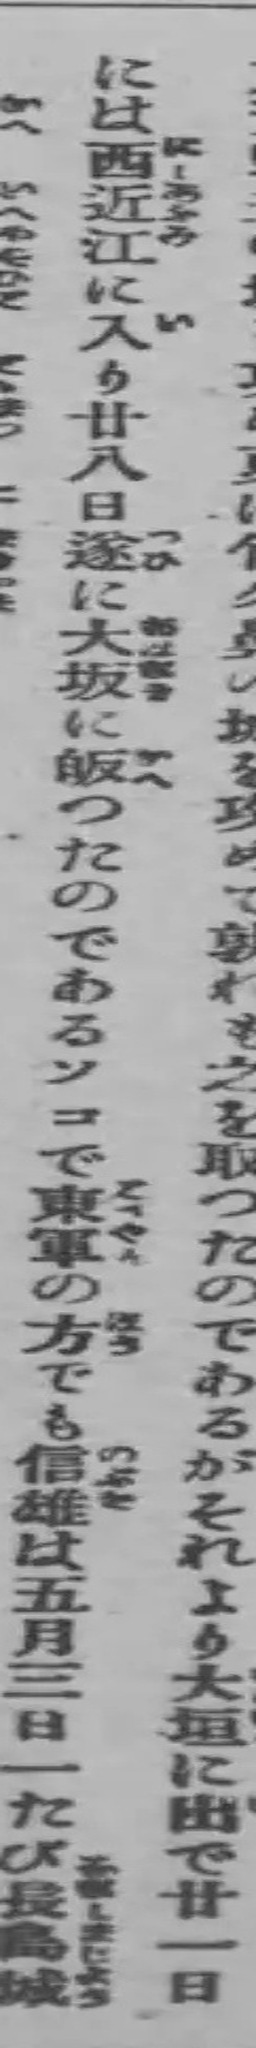には西近江に入り廿八日遂に大坂に皈つたのであるソコで東軍の方でも信雄は五月三日一たび長島城
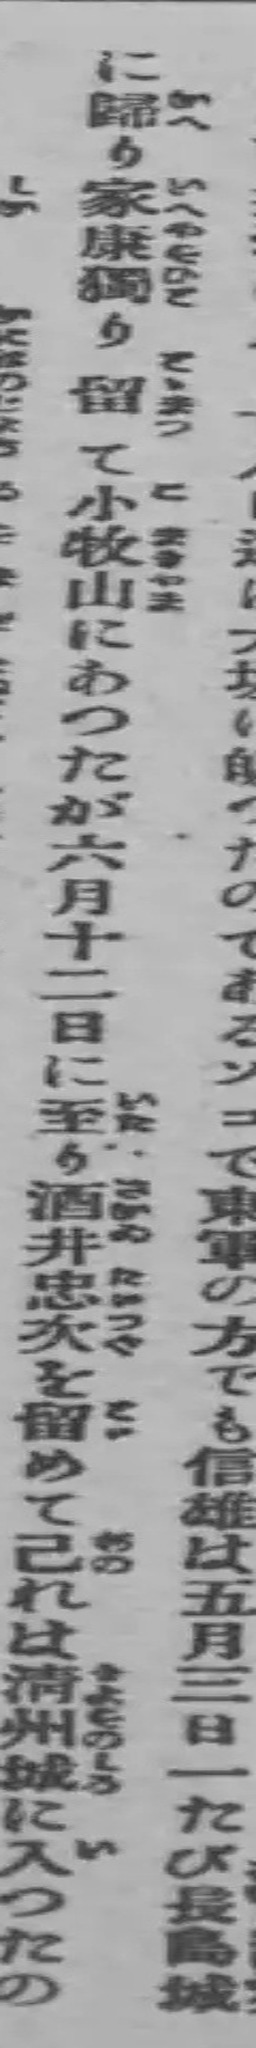に帰り家康独り留て小牧山にあつたが六月十二日に至り酒井忠次を留めて己れは清洲城に入つたの
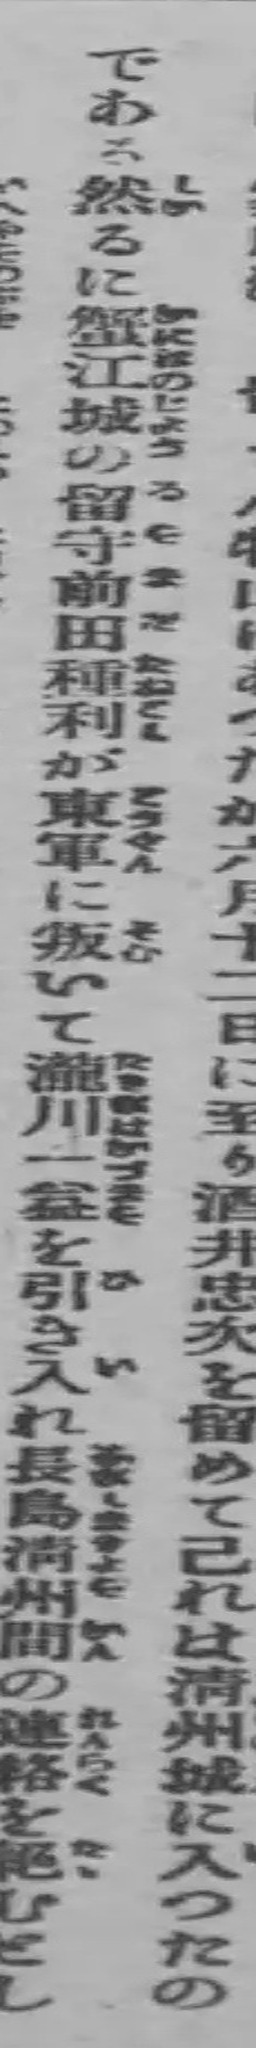である然るに蟹江城の留守前田種利が東軍に叛いて瀧川一益を引き入れ長島清洲間の連絡を絶むとし
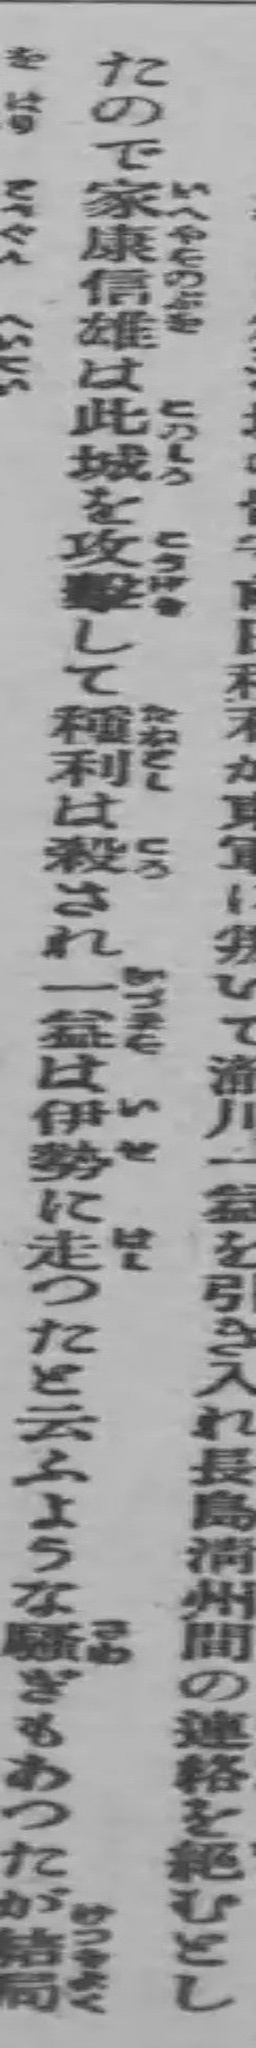たので家康信雄は此城を攻撃して種利は殺され一益は伊勢に走つたと云ふような騒ぎもあつたが結局
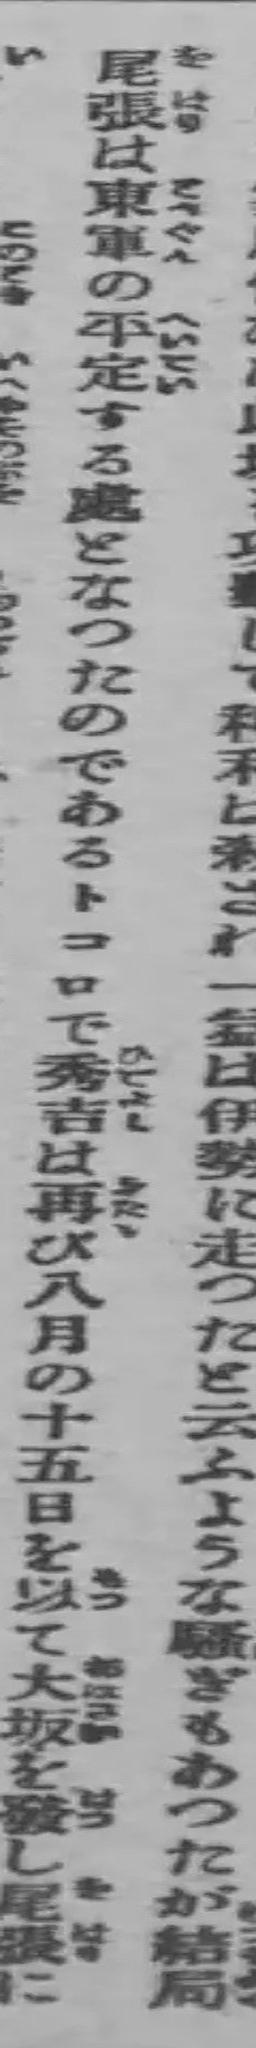尾張は東軍の平定する処となつたのであるトコロで秀吉は再び八月の十五日を以て大坂を発し尾張に
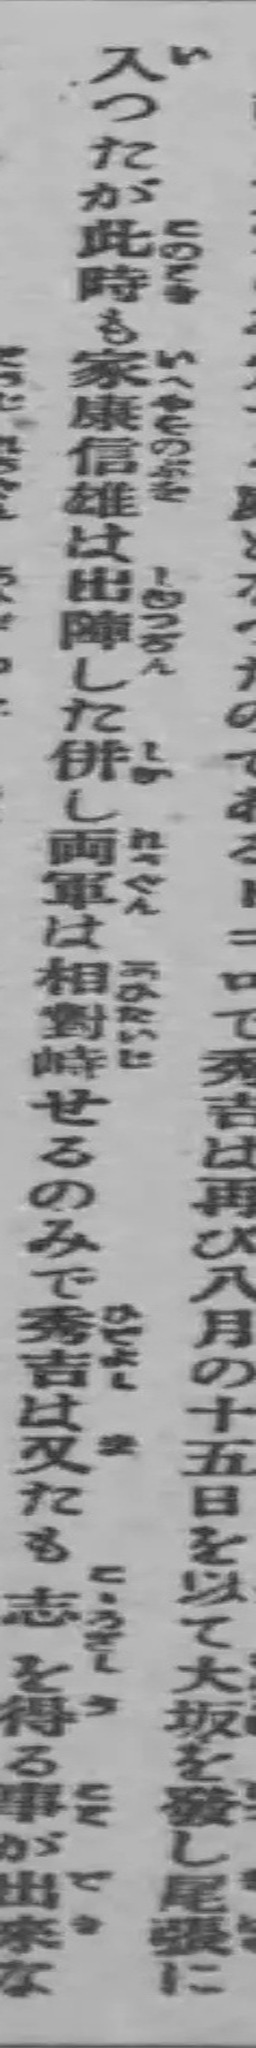入つたが此時も家康信雄は出陣した併し両軍は相対峙せるのみで秀吉は又たも志を得る事が出来な
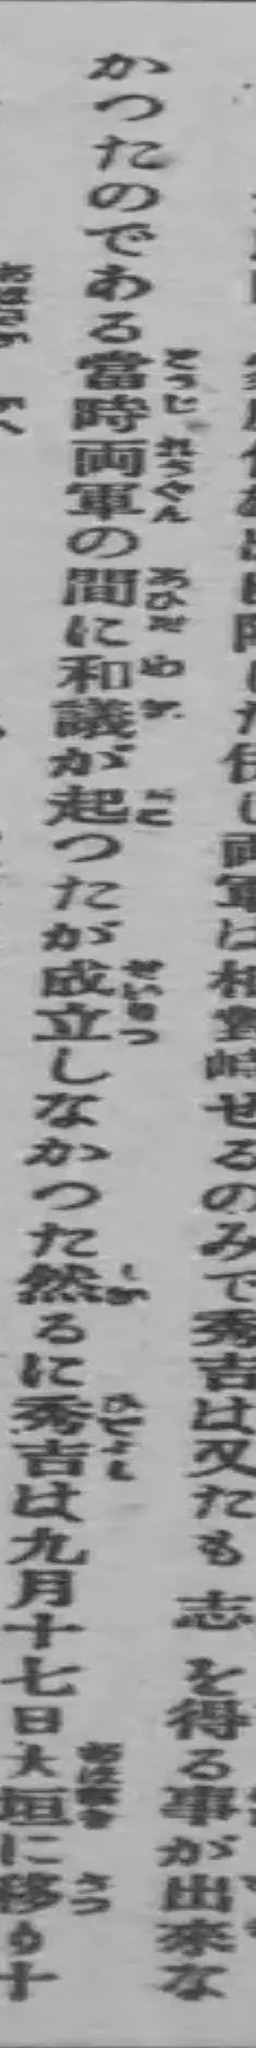かつたのである当時両軍の間に和議が起つたが成立しなかつた然るに秀吉は九月十七日大垣に移り十
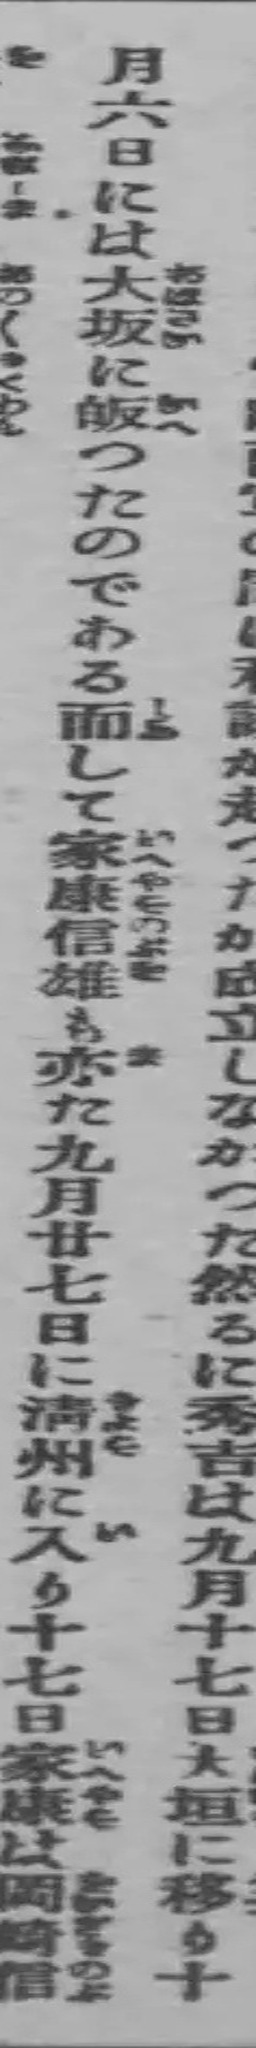月六日には大坂に皈つたのである而して家康信雄も亦た九月廿七日に清洲に入り十七日家康は岡崎信
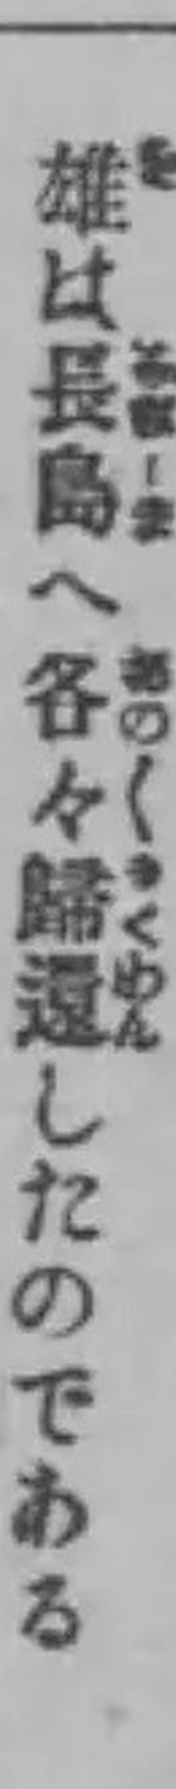雄は長島へ各々帰還したのである
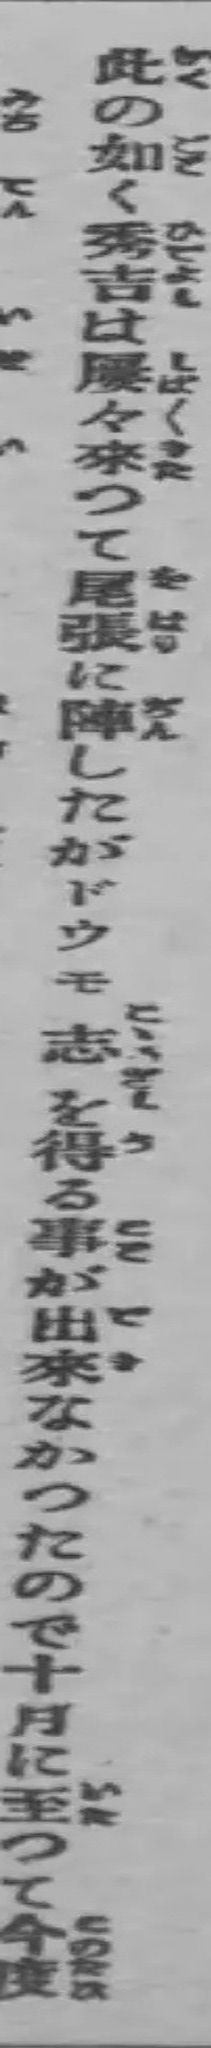此の如く秀吉は屡々来つて尾張に陣したがドウモ志を得る事が出来なかつたので十月に至つて今度
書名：豊橋市史談
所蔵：国立国会図書館 National Diet Library, JAPAN
